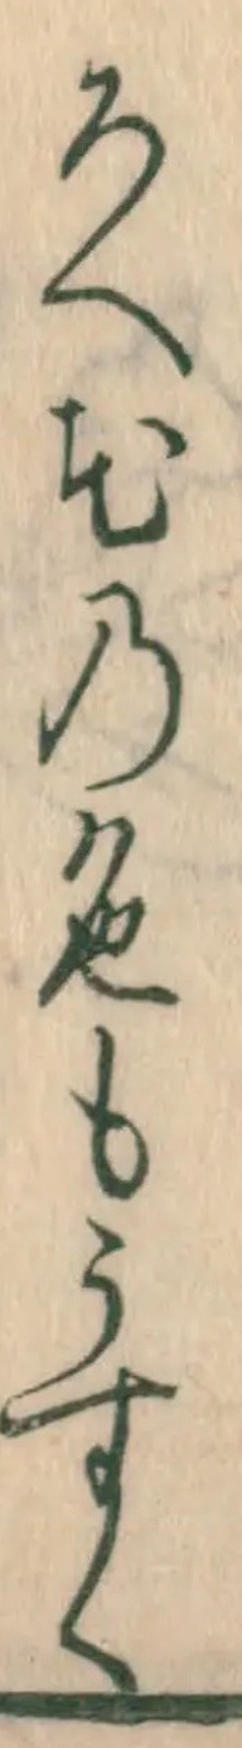ろへ花の色もうすく
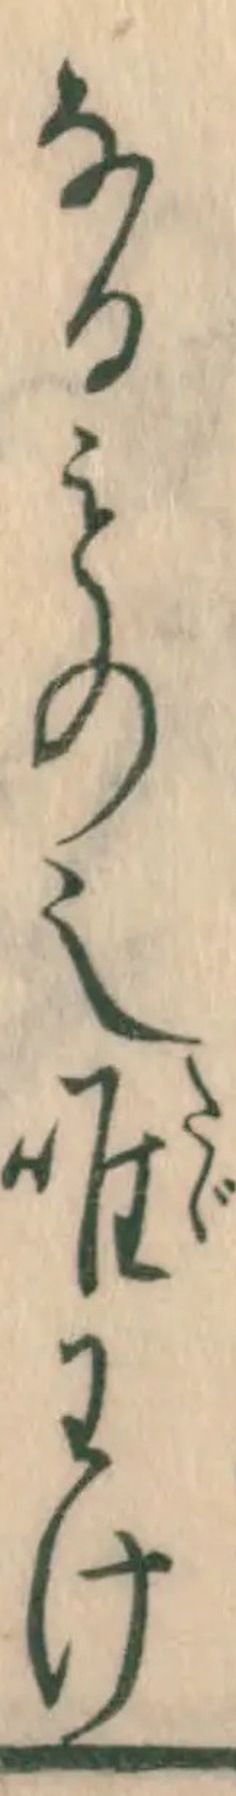なるもの也唯わけ
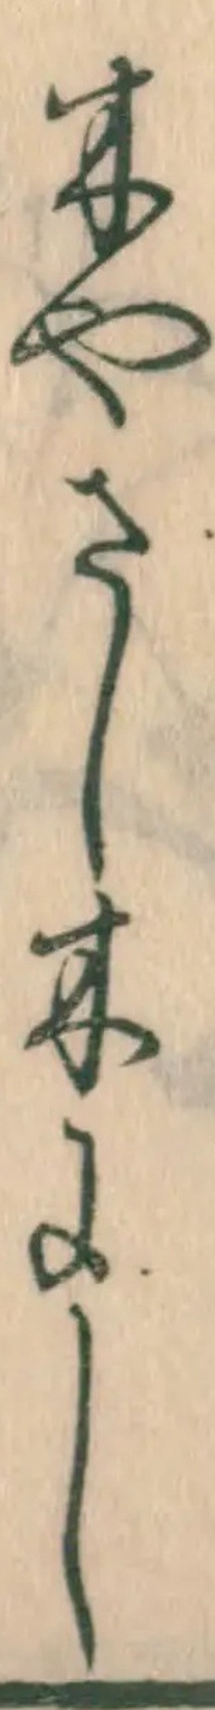木やさし木にし
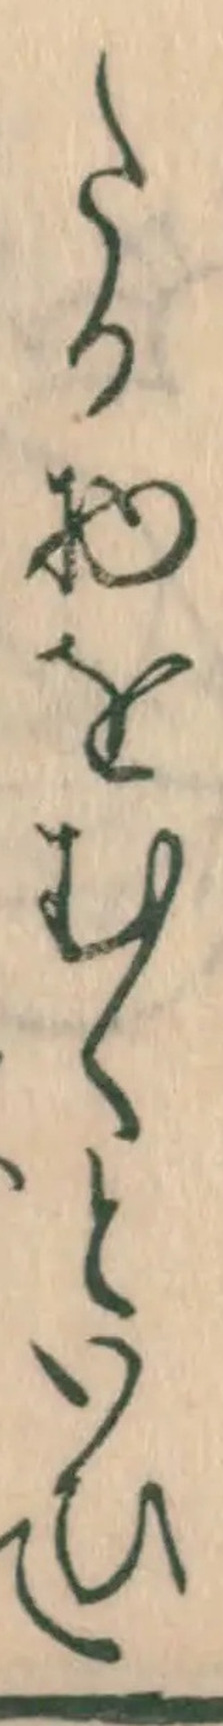たり物をむくといひて
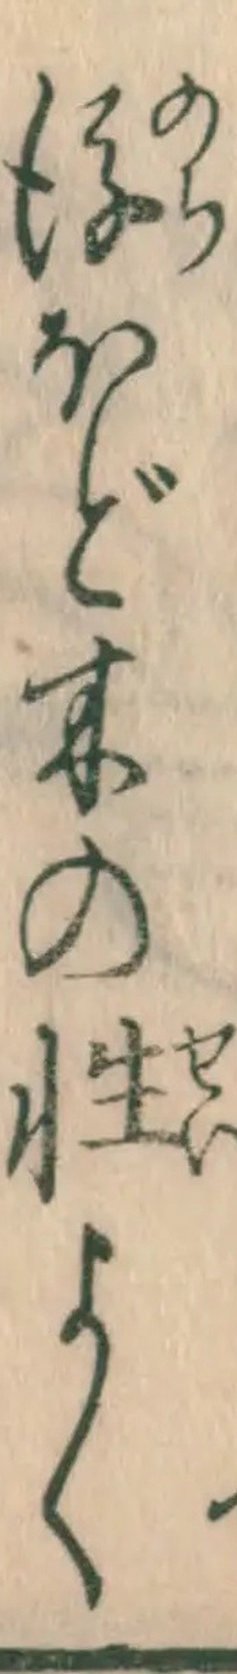後ほど木の性よく
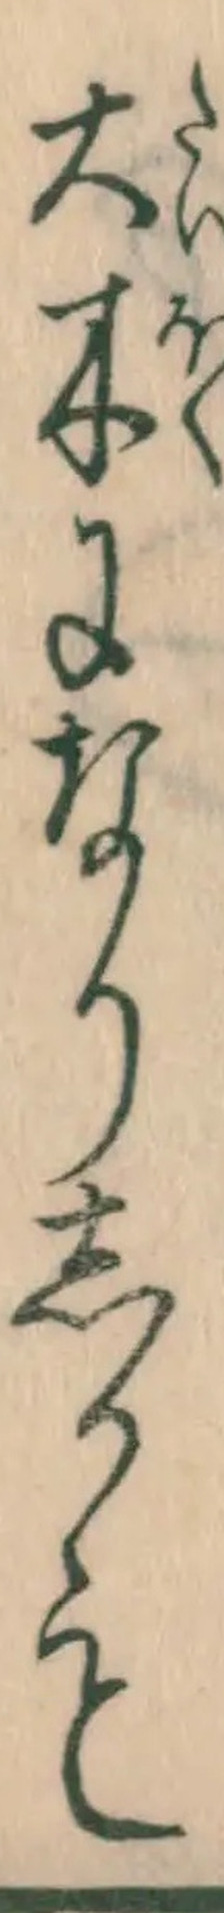大木になりしかも
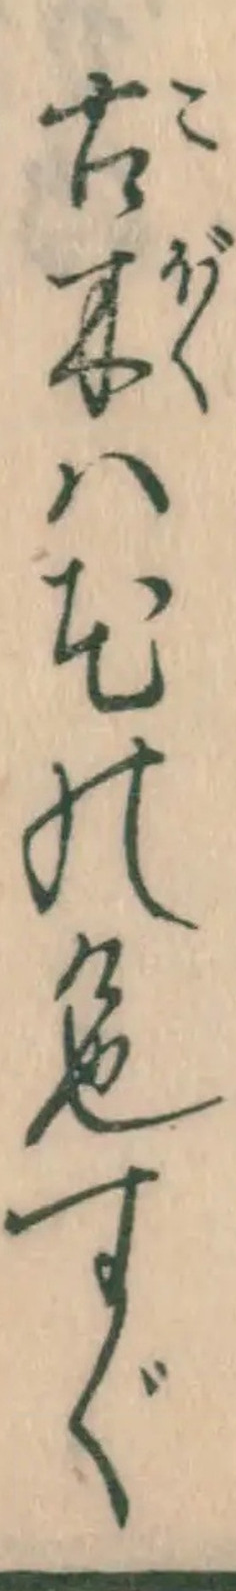古木は花の色すぐ
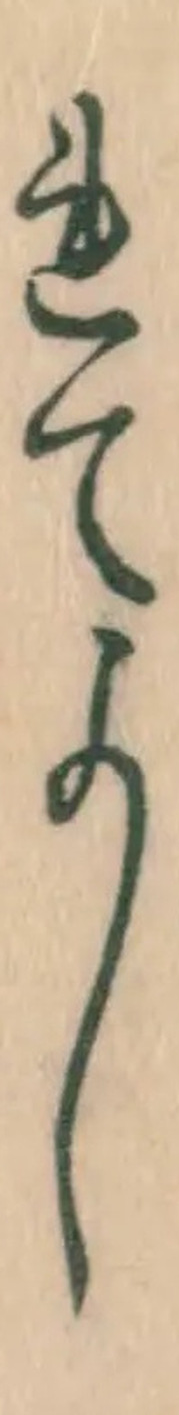れてよし
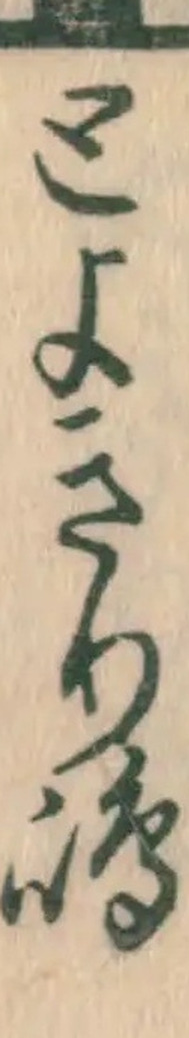とよきり嶋
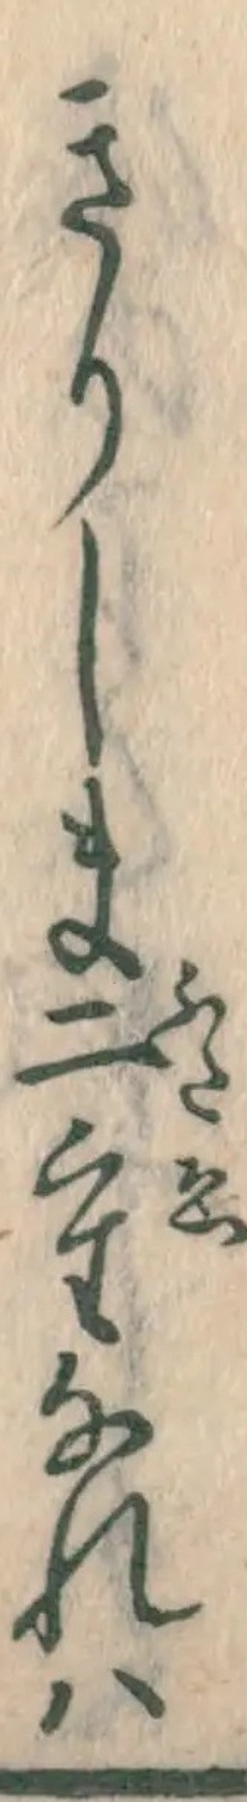きりしま二重なれは
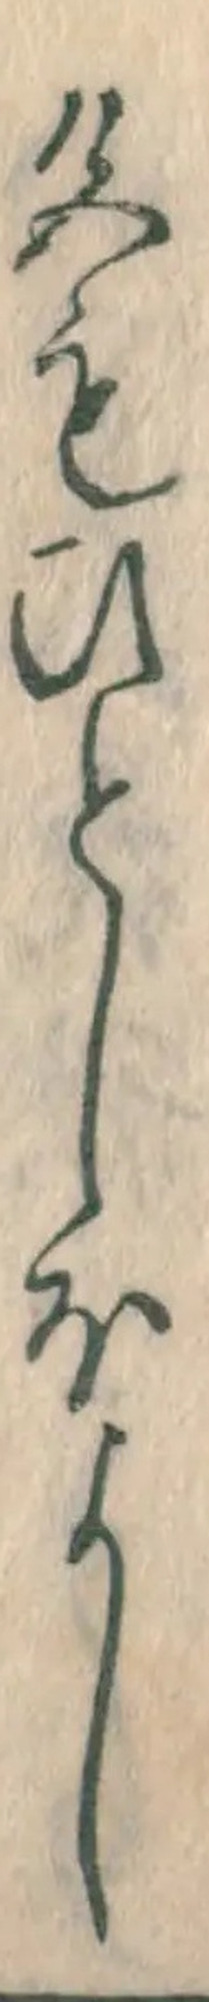色もひとしほよし
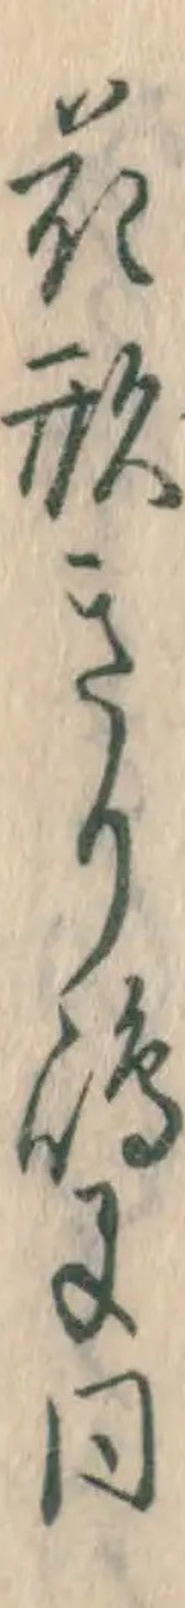花形きり嶋に同

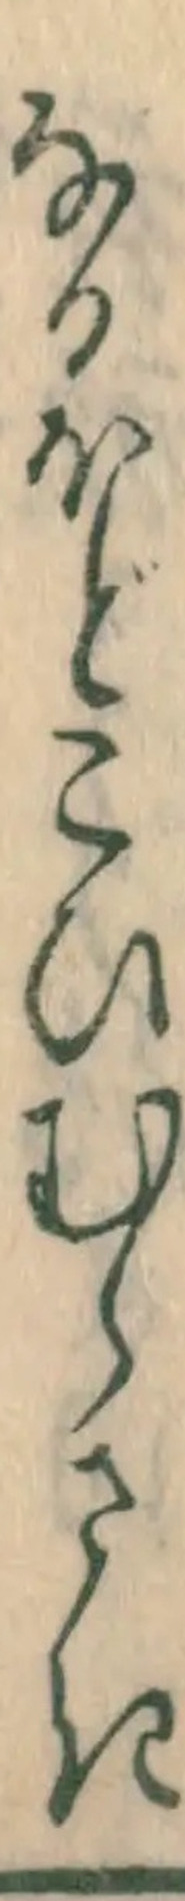なるほどこひむらさき
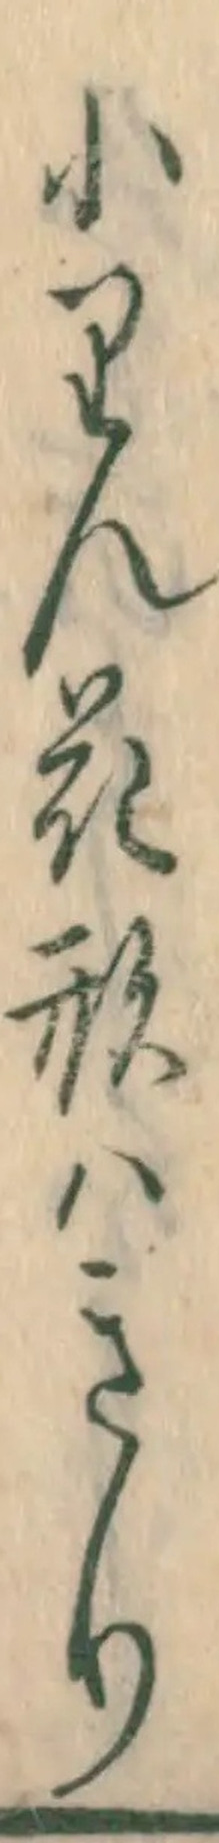小りん花形はきり
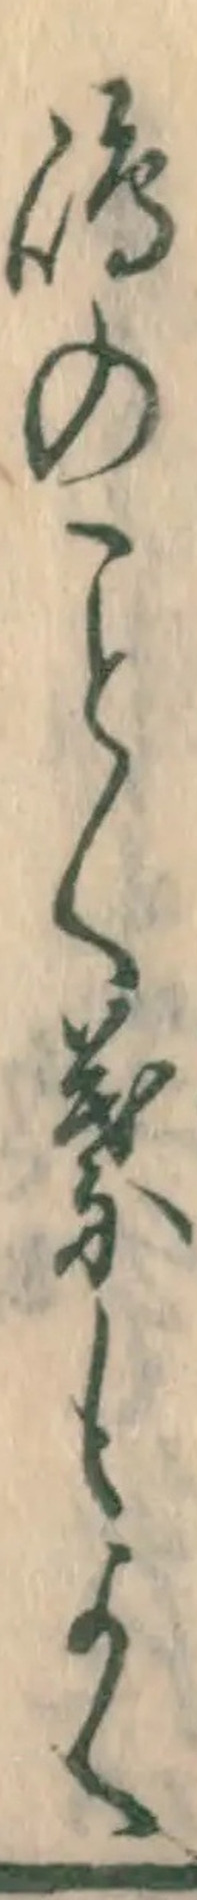嶋のことく葉もよく
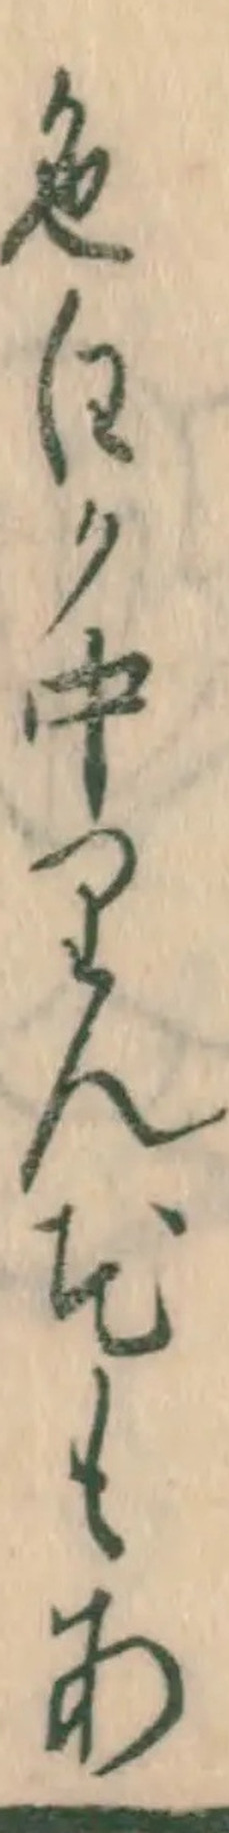色白く中りん花もあ
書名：錦繍枕 5巻. [1]
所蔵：国立国会図書館 National Diet Library, JAPAN
